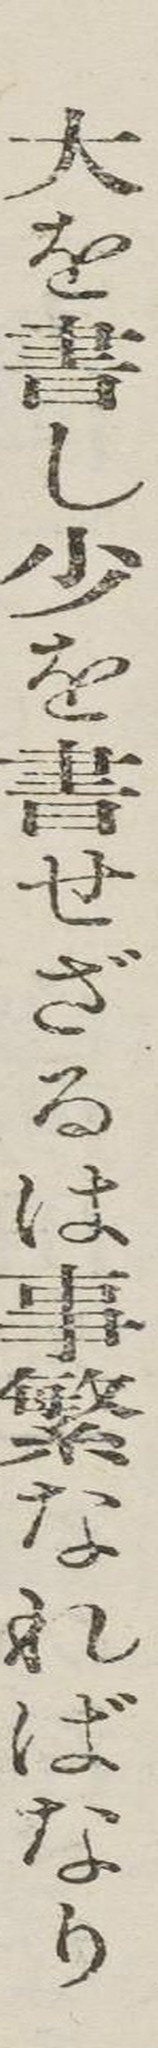大を書し少を書せざるは事繁なればなり
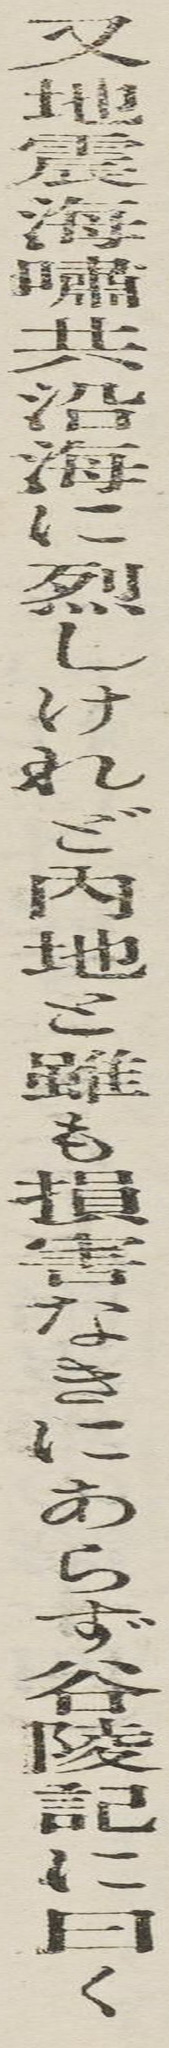又地震海嘯共沿海に烈しけれど内地と雖も損害なきにあらず谷陵記に曰く
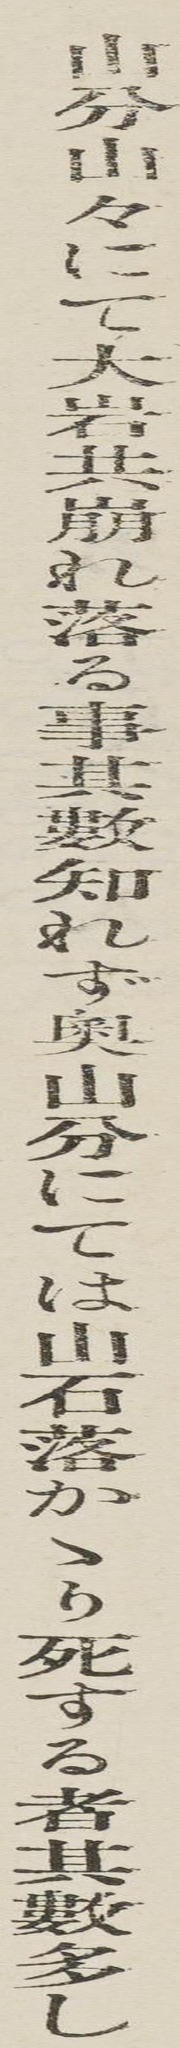山分山々にて大岩共崩れ落る事其数知れず山分にては山石落かゝり死する者其数多し
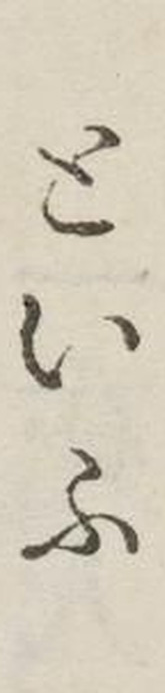といふ
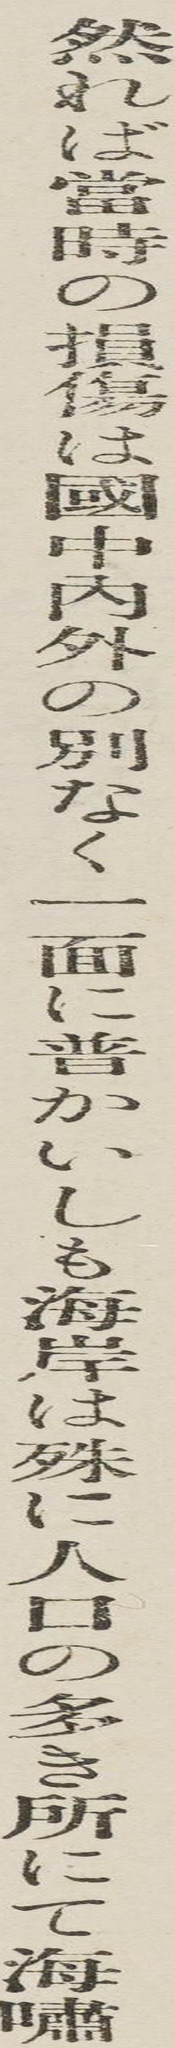然れば当時の損傷は国中内外の別なく一面に普かいしも海岸は殊に人口の多き所にて海嘯
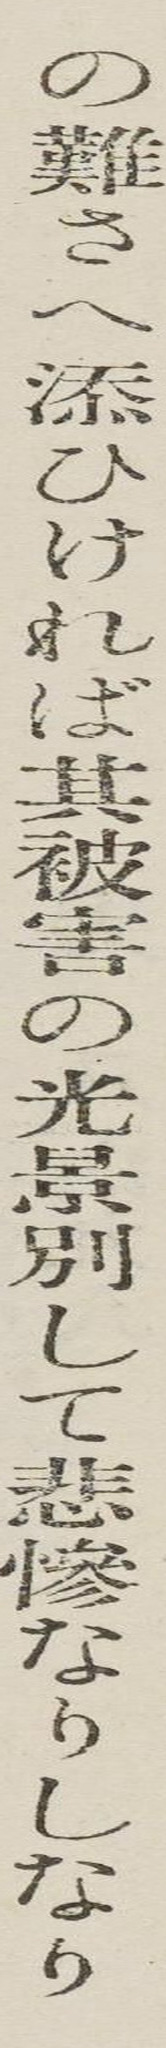の難さへ添ひければ其被害の光景別して悲惨なりしなり
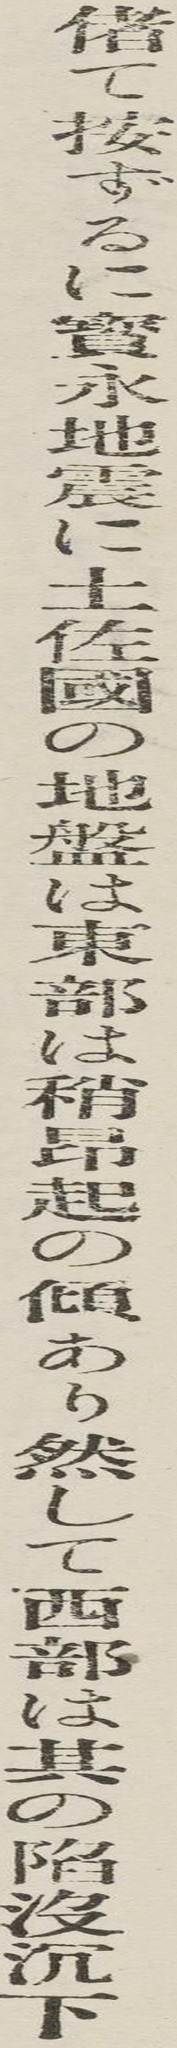偖て按ずるに宝永地震に土佐国の地盤は東部は稍昴起の傾あり然して西部は其の陥没沉下
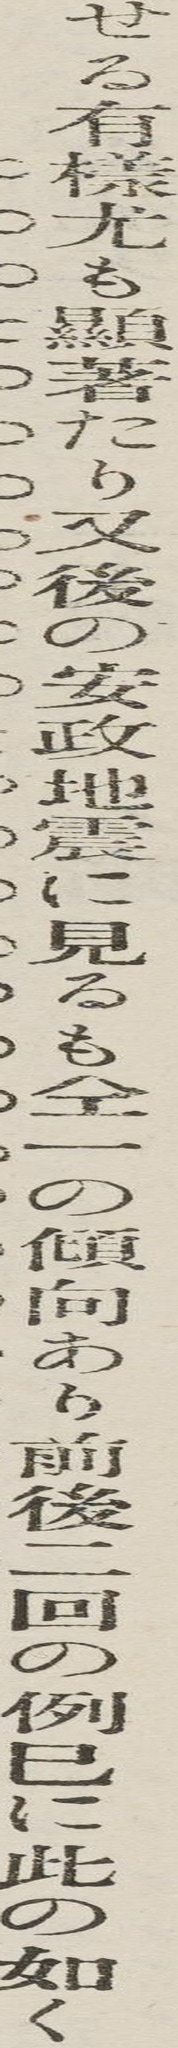せる有様尤も顕著たり又後の安政地震に見るも同一の傾向あり前後二回の例巳に此の如く
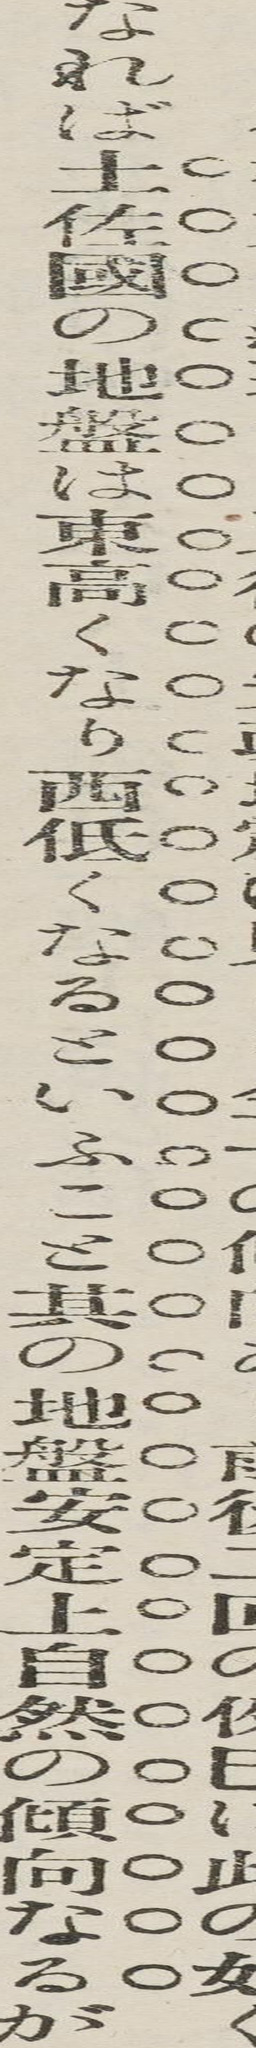なれば土佐国の地盤は東高くなり西低くなるといふこと其の地盤安定上自然の傾向なるが
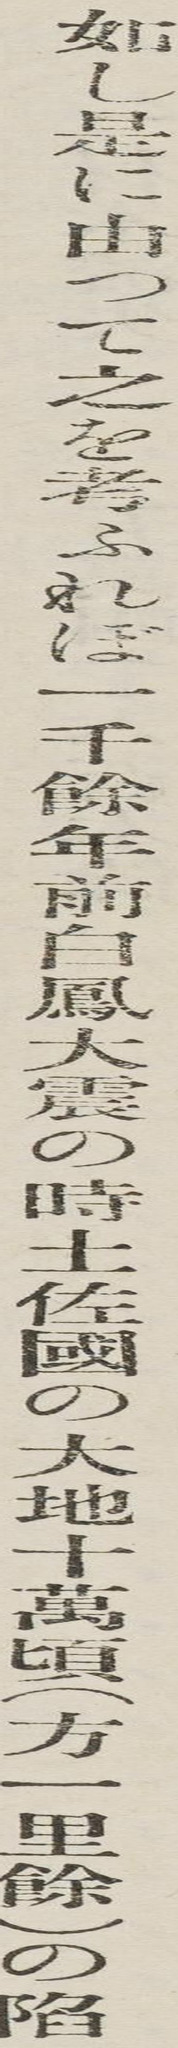如し是に由つて之を考ふれば一千余年前白鳳大震の時土佐国の大地十万頃の陥
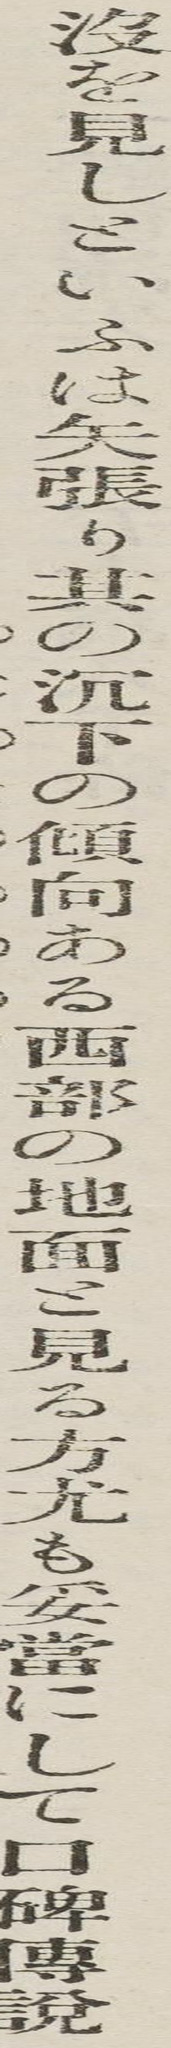没を見しといふは矢張り其の沉下の傾向ある西部の地面と見る方尤も妥当にして口碑伝説
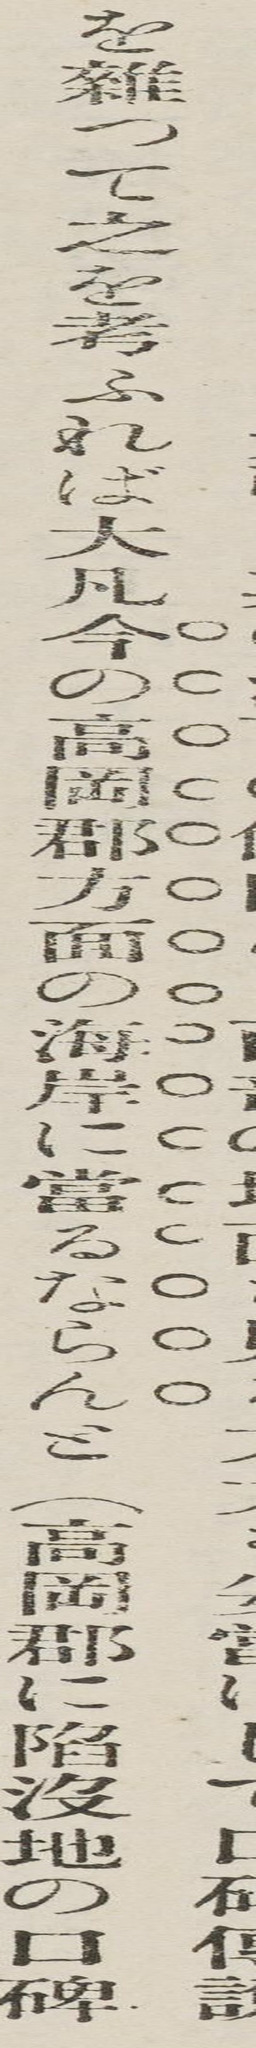を雜つて之を考ふれば大凡今の高岡郡方面の海岸に当るならんと（高岡郡に陥没地の口碑
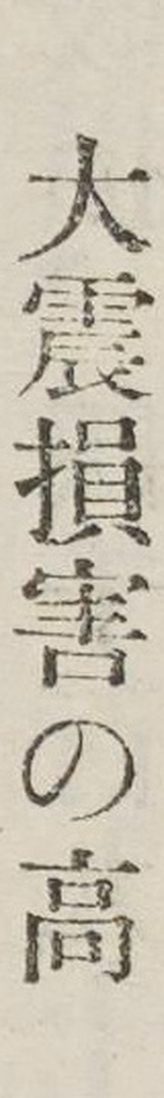大震損害の高
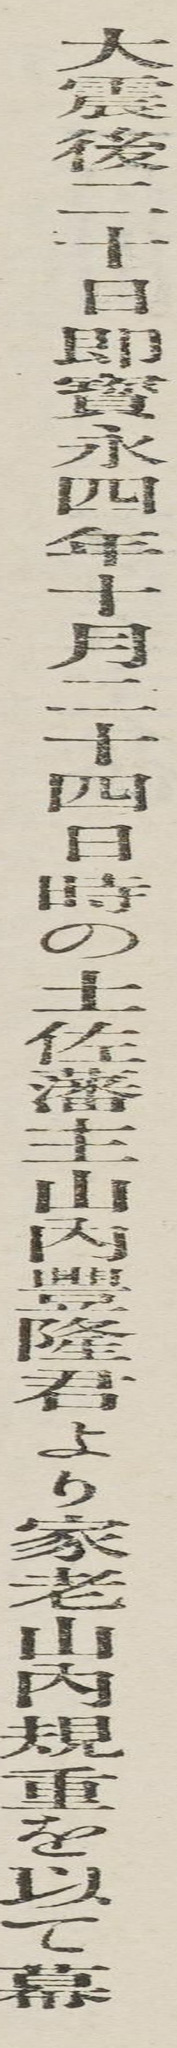大震後二十日即宝永四年十月二十四日時の土佐藩主山内豊隆君より家老山内規重を以て幕
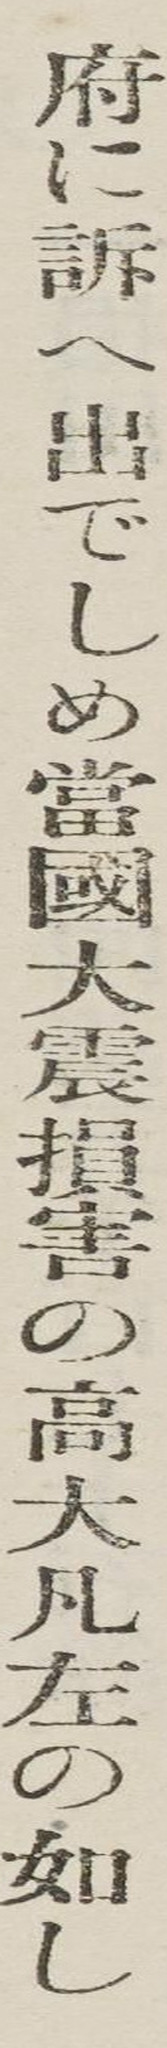府に訴へ出でしめ当国大震損害の高大凡左の如し
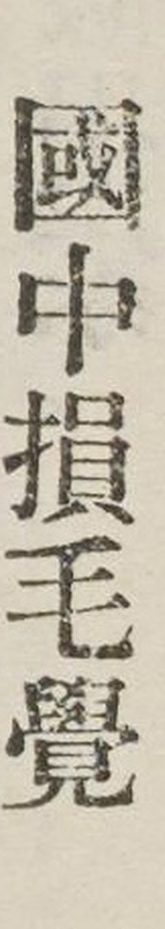国中損毛覚
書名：土佐古今ノ地震
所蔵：東京大学地震研究所図書室 Earthquake Research Institute Library, The University of Tokyo, JAPAN
